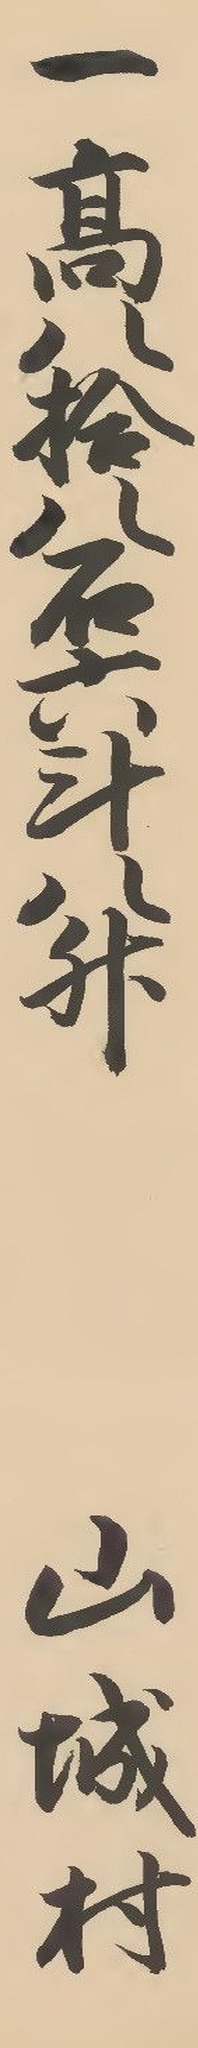一高八拾八石六斗八升山城村
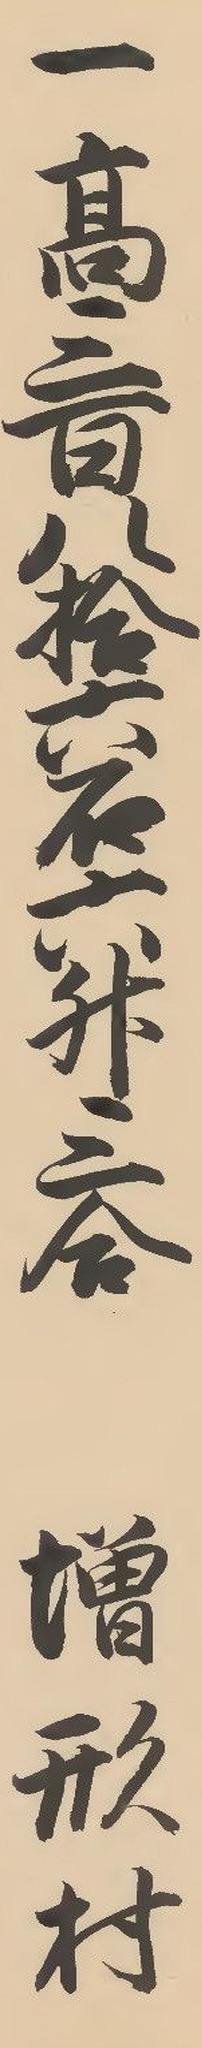一高三百八拾六石六升三合増形村
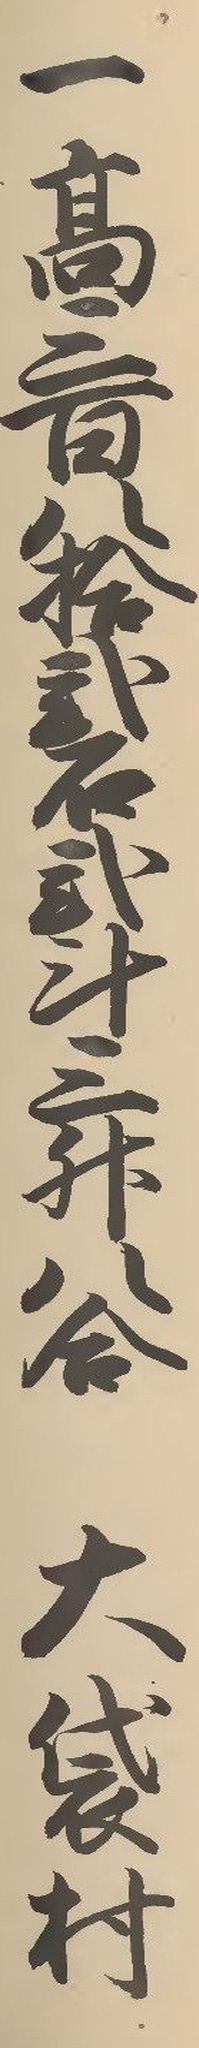一高三百八拾弐石弐斗三升八合大袋村
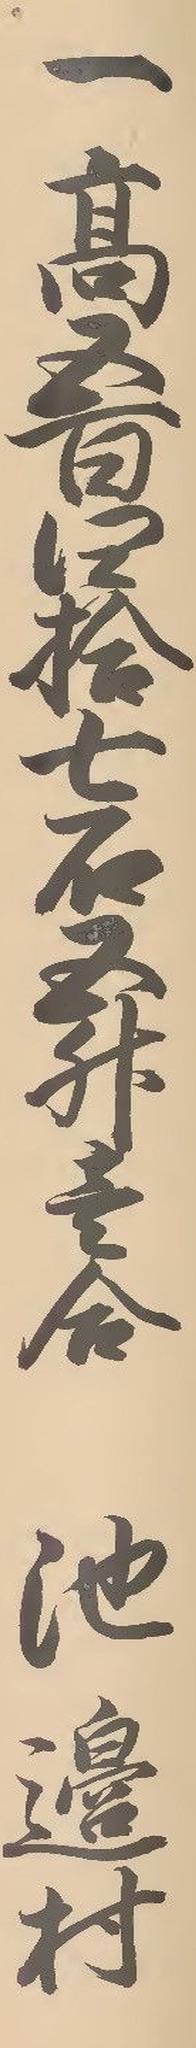一高五百四拾七石五升壱合池辺村
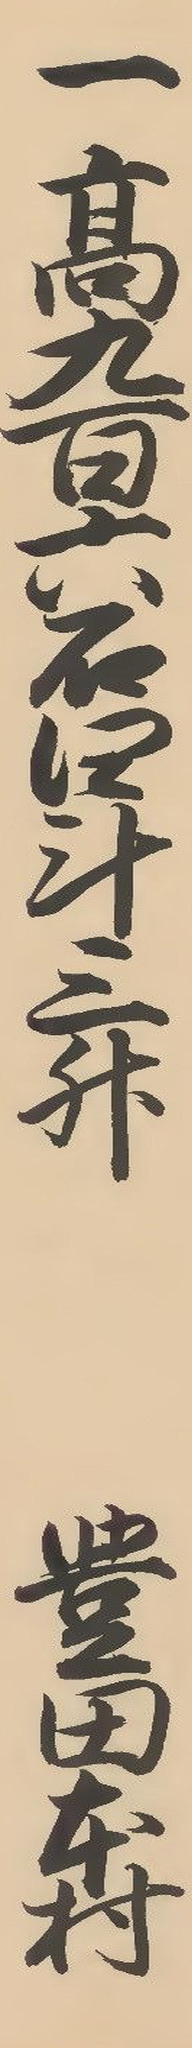一高九百六石四斗三升豊田本村
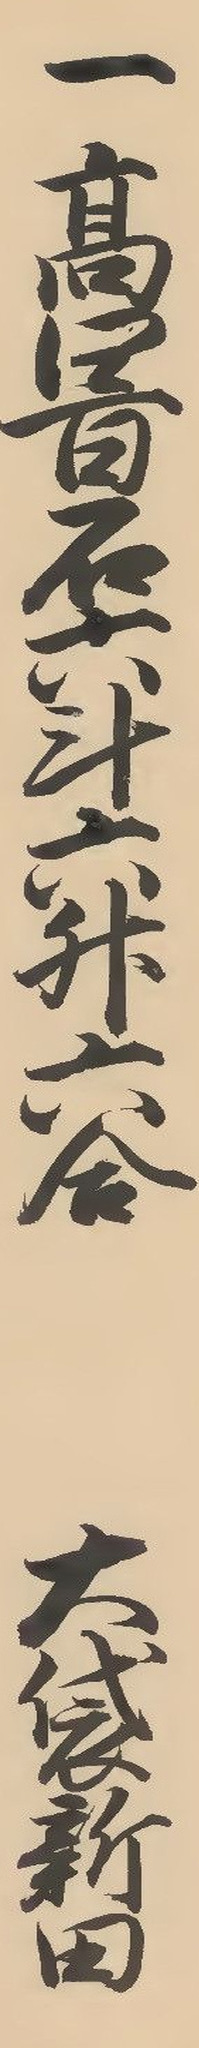一高四百石六斗六升六合大袋新田
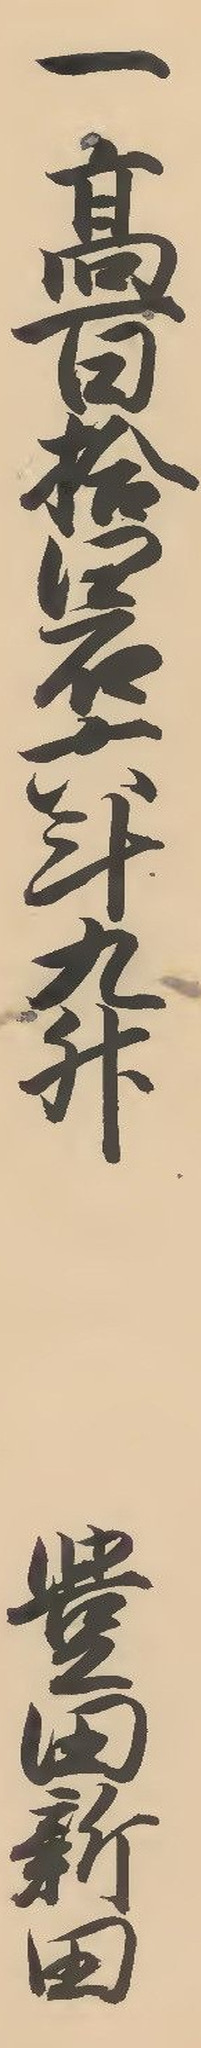一高百拾四石六斗九升豊田新田

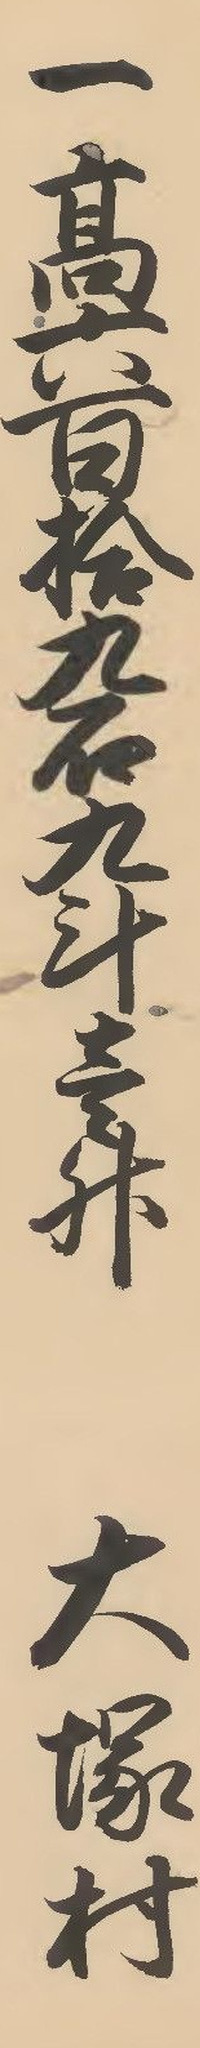一高六百拾九石九斗壱升大塚村
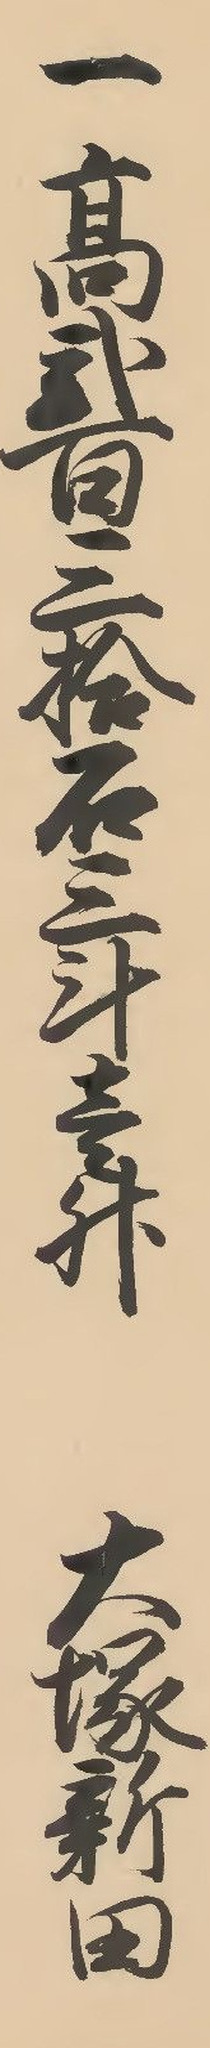一高弐百三拾石三斗壱升大塚新田
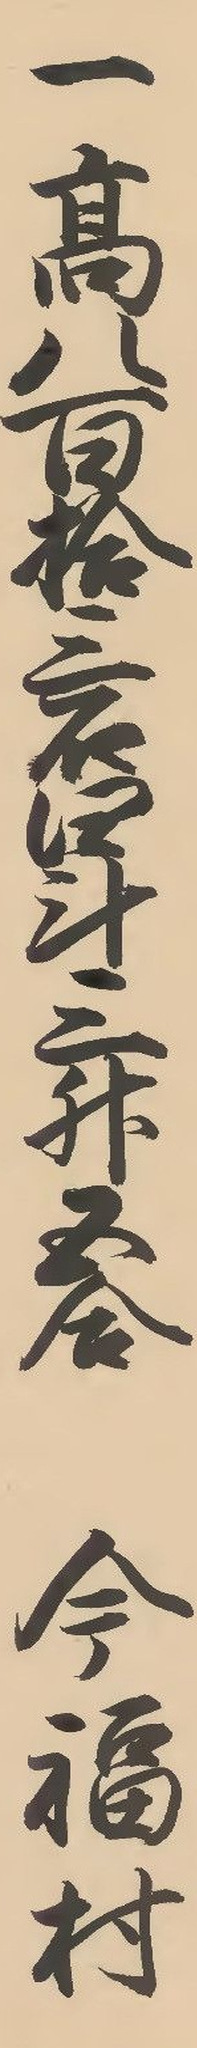一高八百拾三石四斗三升五合今福村
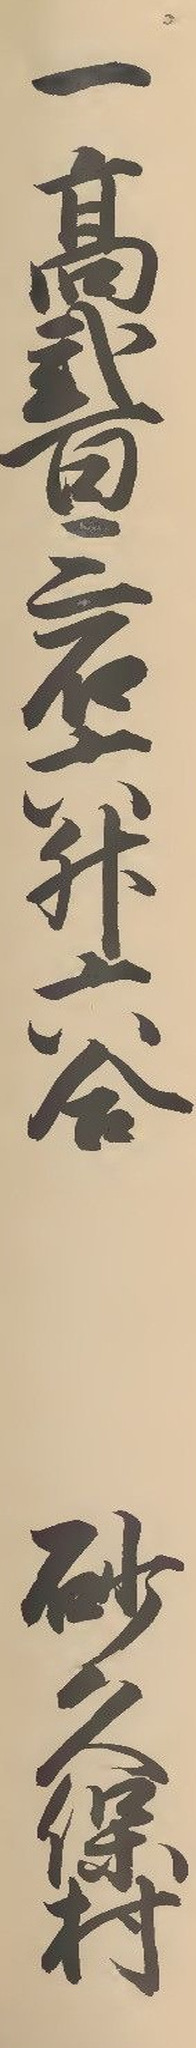一高弐百三石六升六合砂久保村
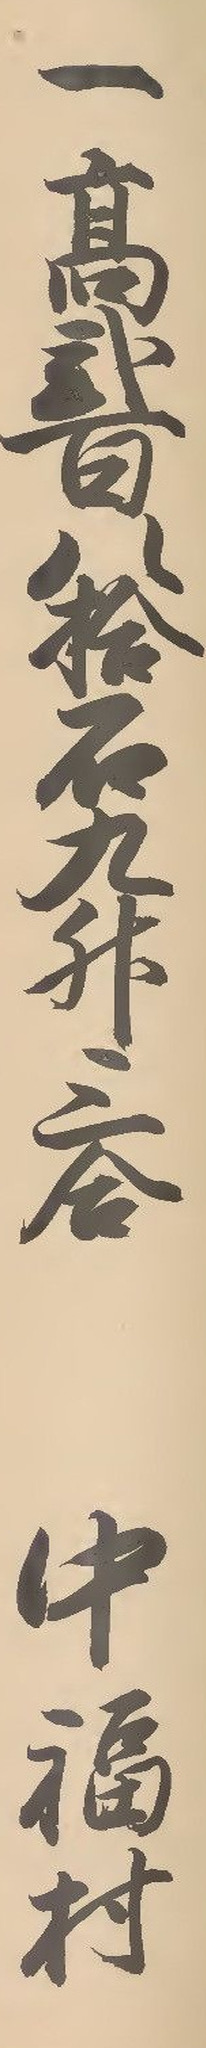一高弐八拾石九升三合中福村
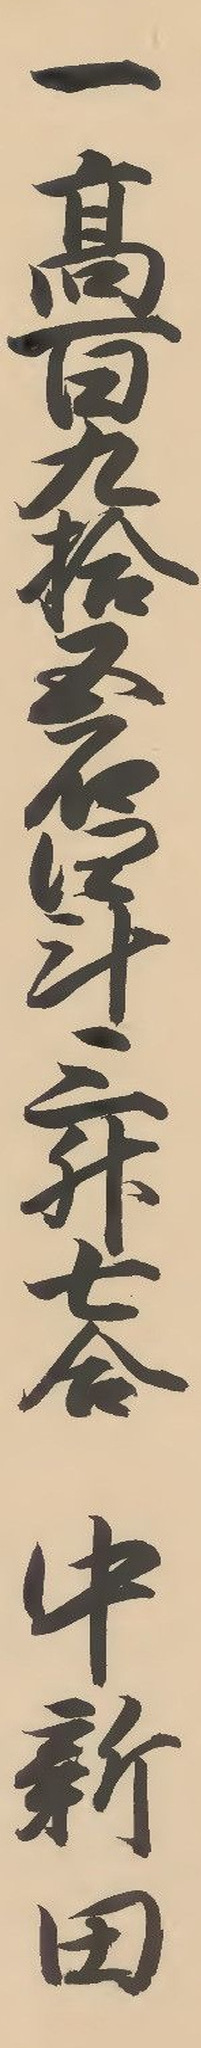一高百九拾五石四斗三升七合中新田
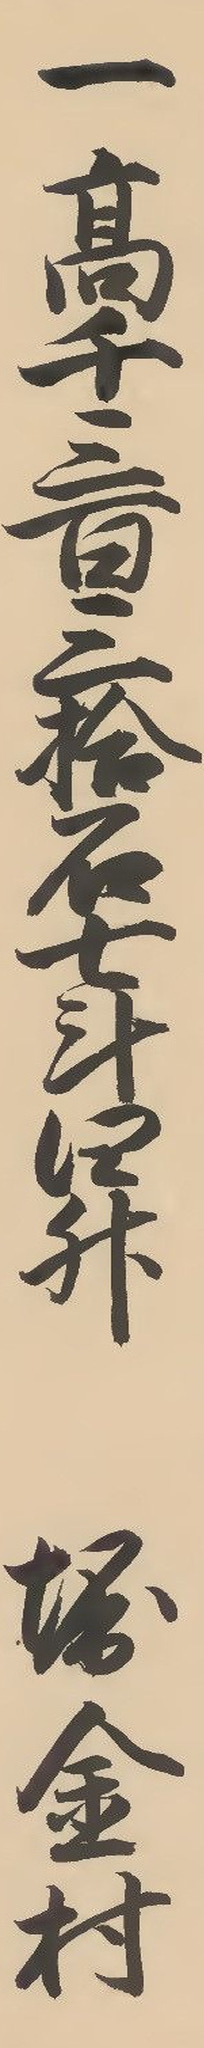一高千三百三拾石七斗四升堀金村
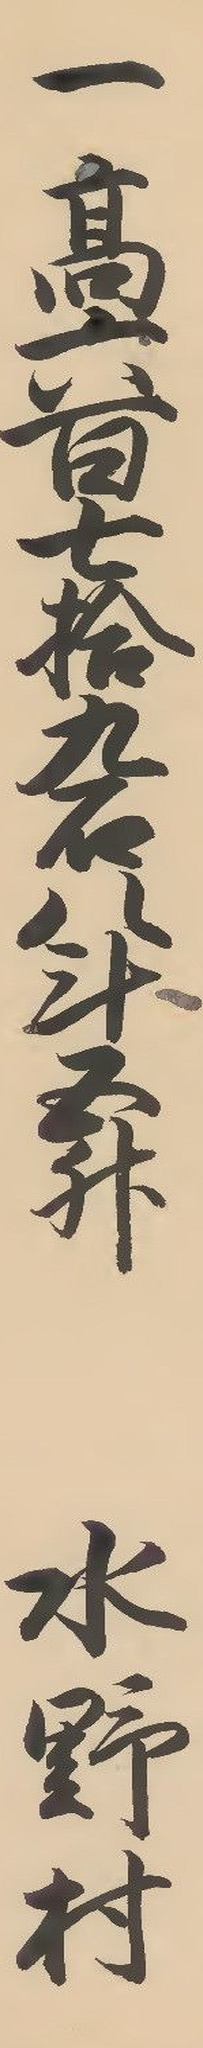一高六百七拾九石八斗五升水野村

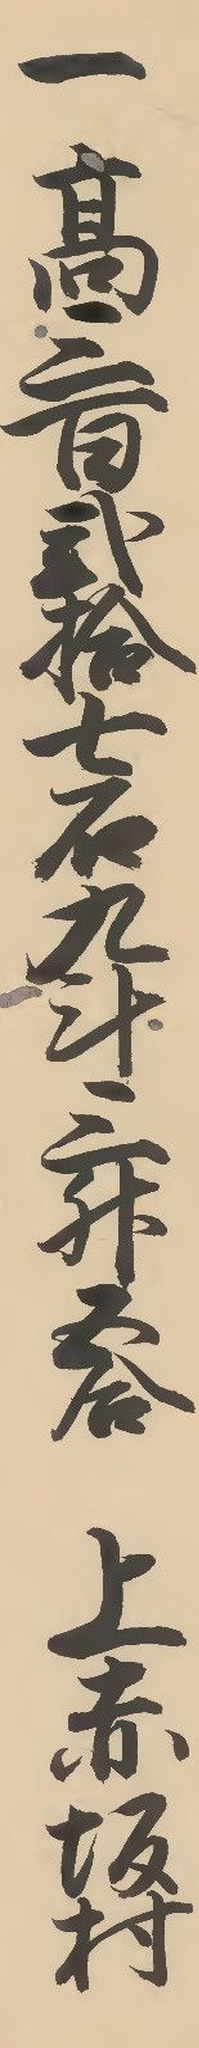一高三百弐拾七石九斗三升五合上赤坂村
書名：武蔵国郷帳　上
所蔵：国立公文書館 National Archives of Japan
